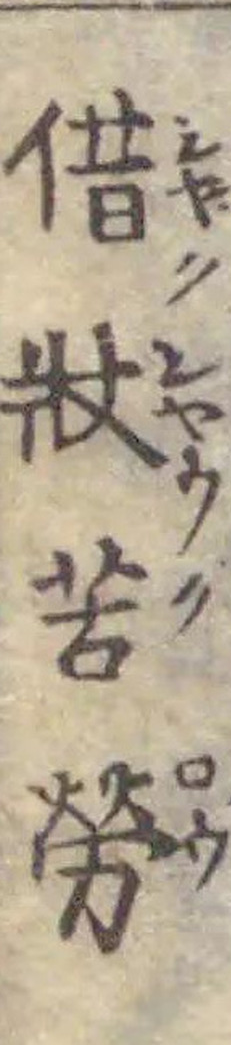借状苦労

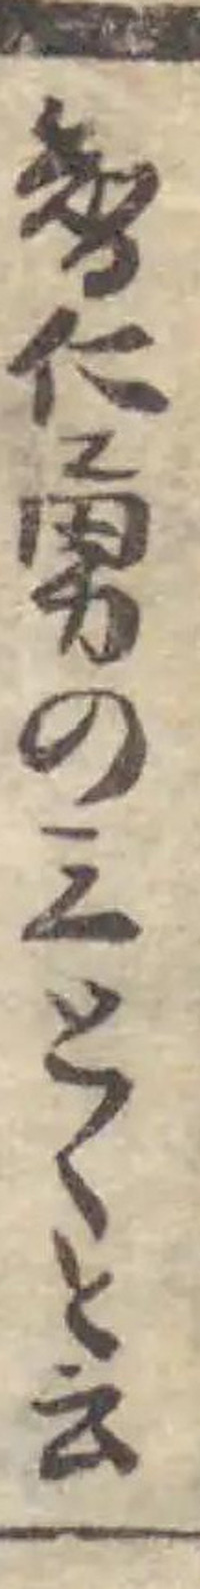智仁勇の三とくと云
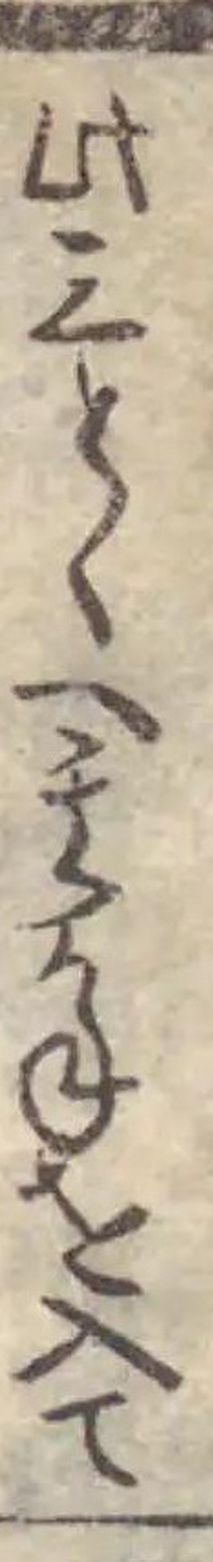此三とくへ其かねを入て
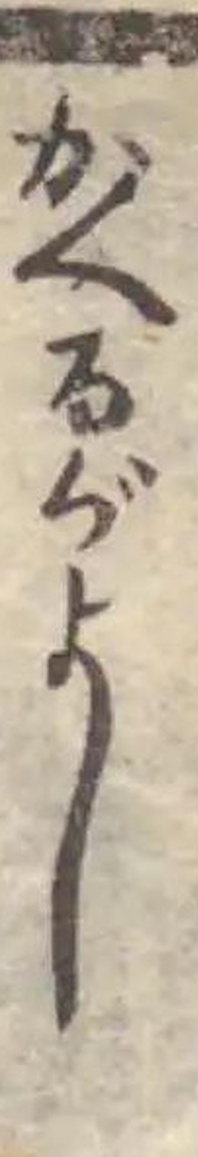かへるがよし
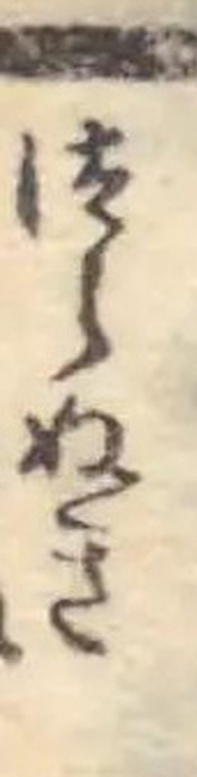つらぬき
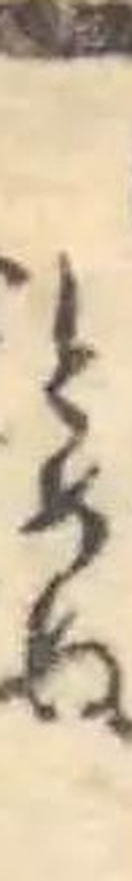とめぬ
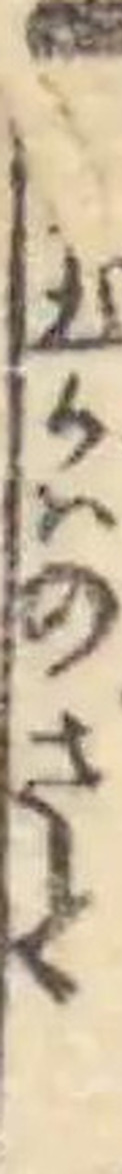玉かはのさと
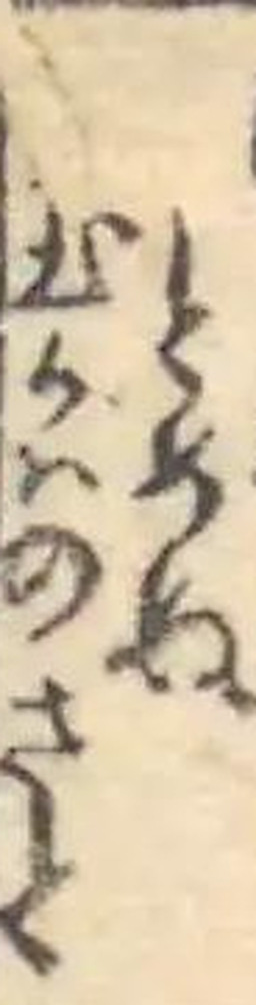玉かはのさと
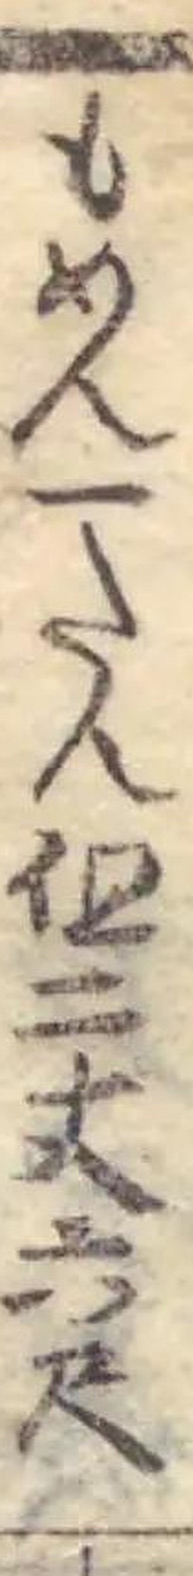もめん一たん但二丈六尺
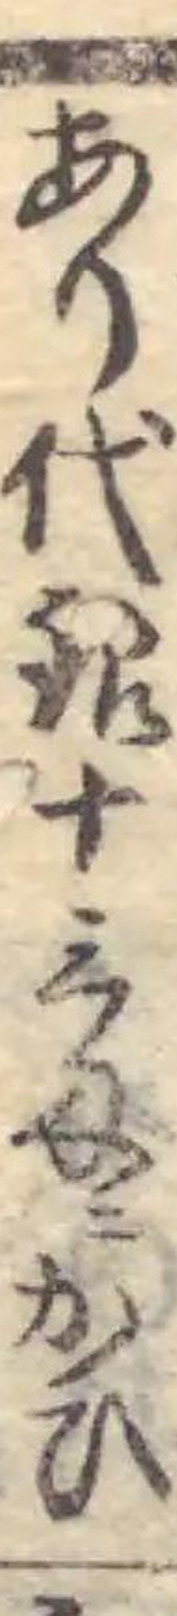あり代銀十三匁にかひ
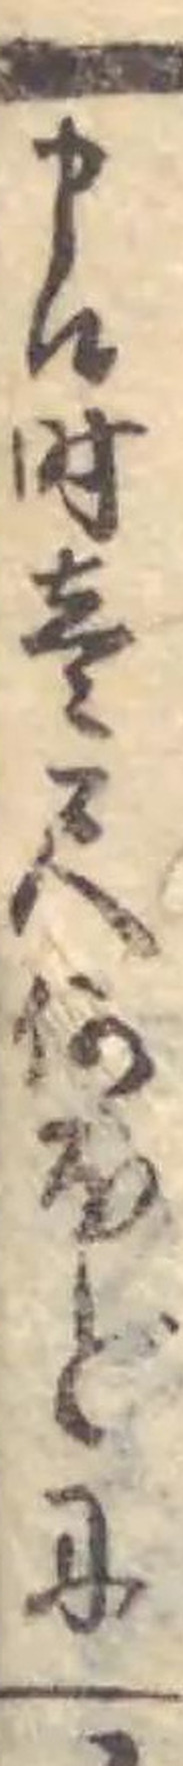申候時壱尺何ほどに
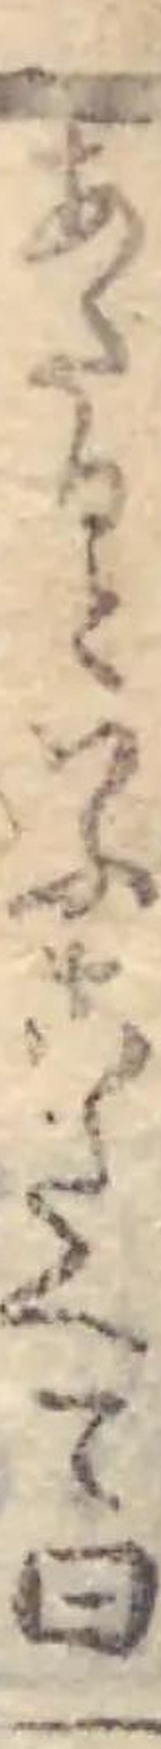あたるといふこたへて曰
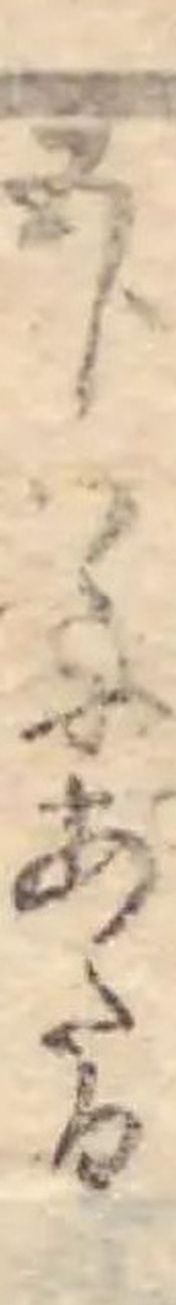五分つゝにあたる
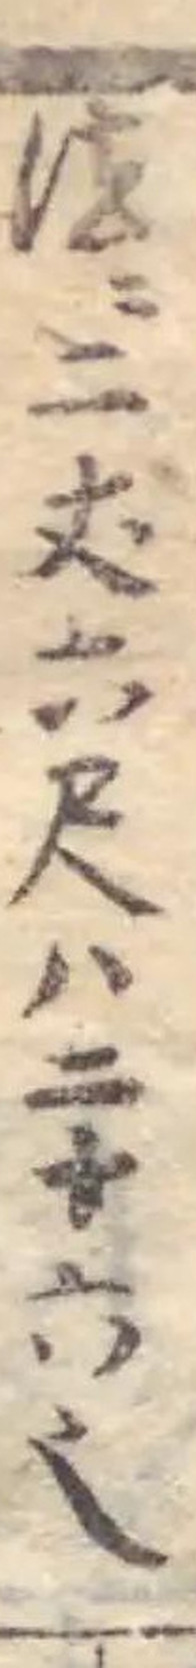法に二丈六尺は二十六也
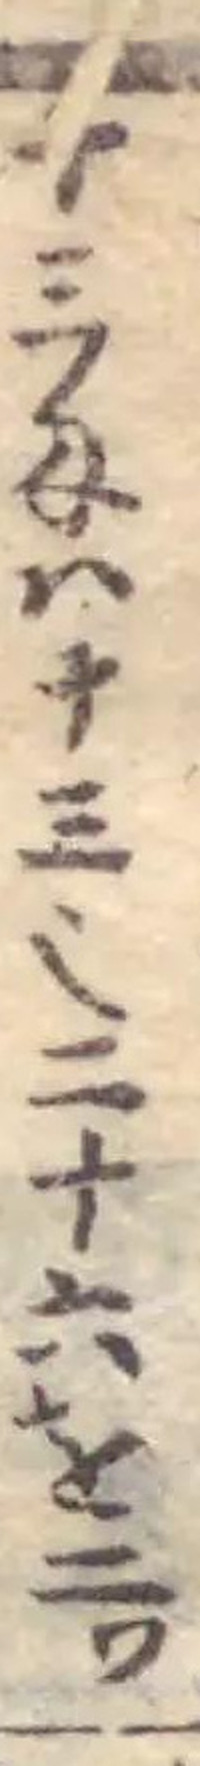十三匁は十三也二十六を二つ
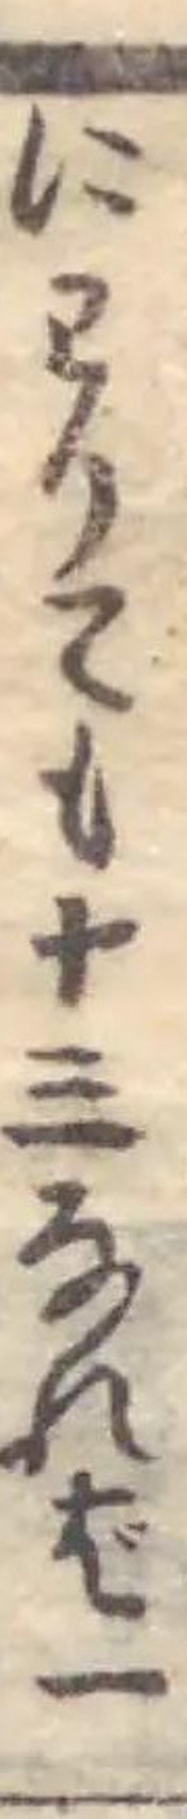にわりても十三なれば一
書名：大通人好記
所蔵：国立国会図書館 National Diet Library, JAPAN
